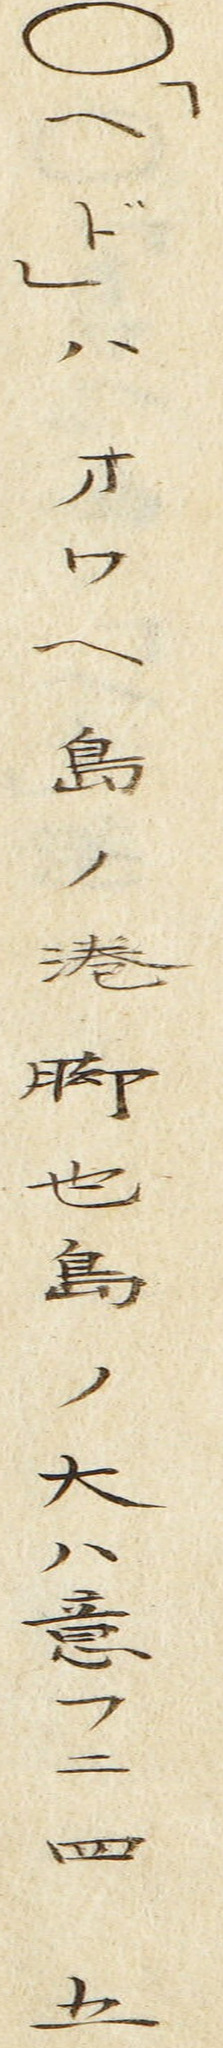○「ヘド」ハオワヘ島ノ港脚也島ノ大ハ意フニ四五
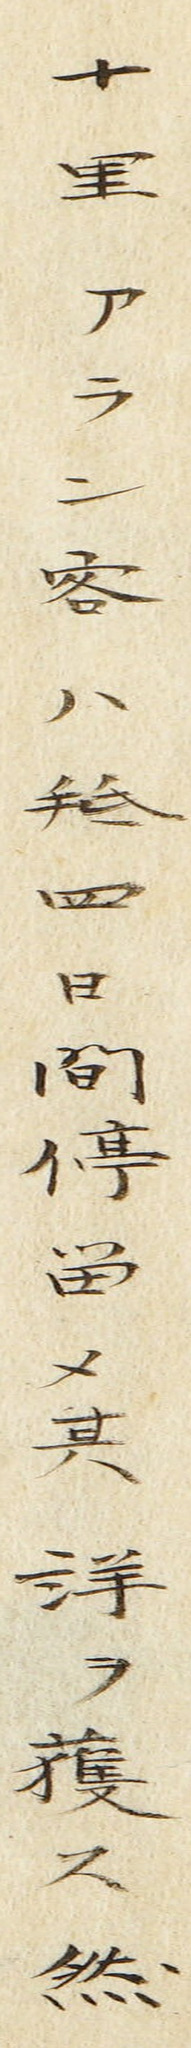十里アラン客ハ抵四日間停留シテ其詳ヲ獲ス然
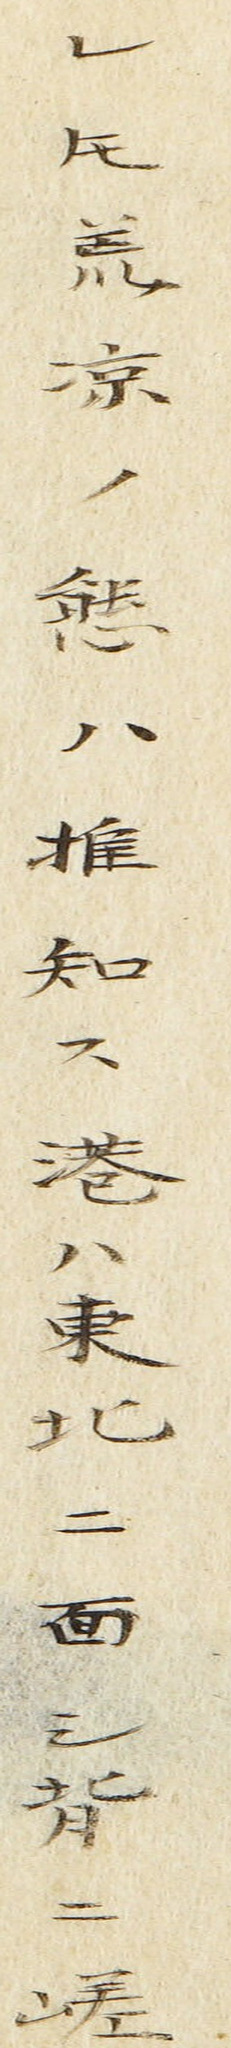レトモ荒涼ノ態ハ推知ス港ハ東北ニ面シ背ニ嵯
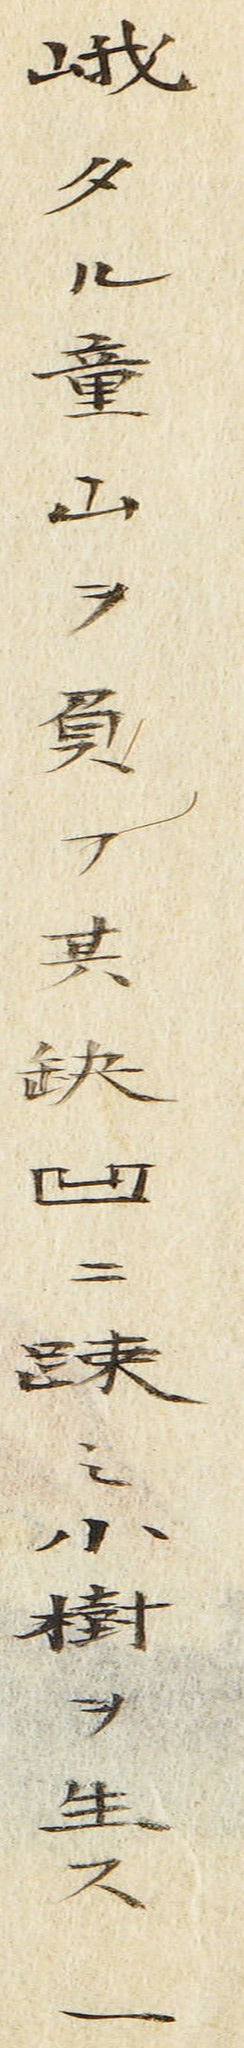峨タル童山ヲ負フ其缺凹ニ疎ミ小樹ヲ生ス一
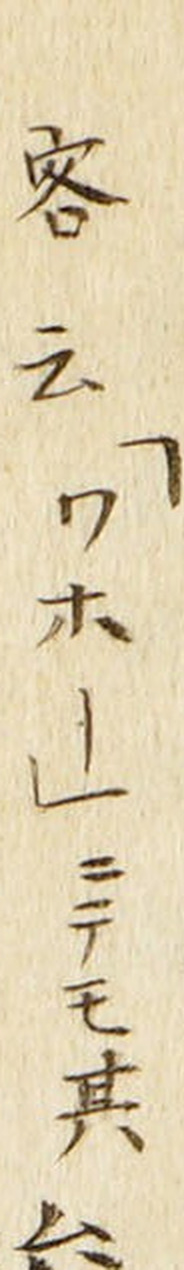客云「ワホー」ニテモ其
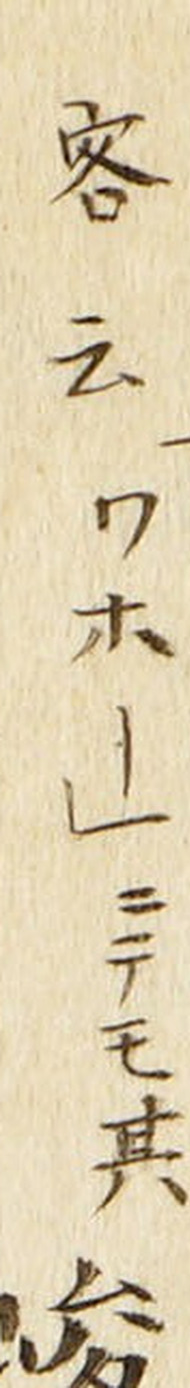客云「ワホー」ニテモ其
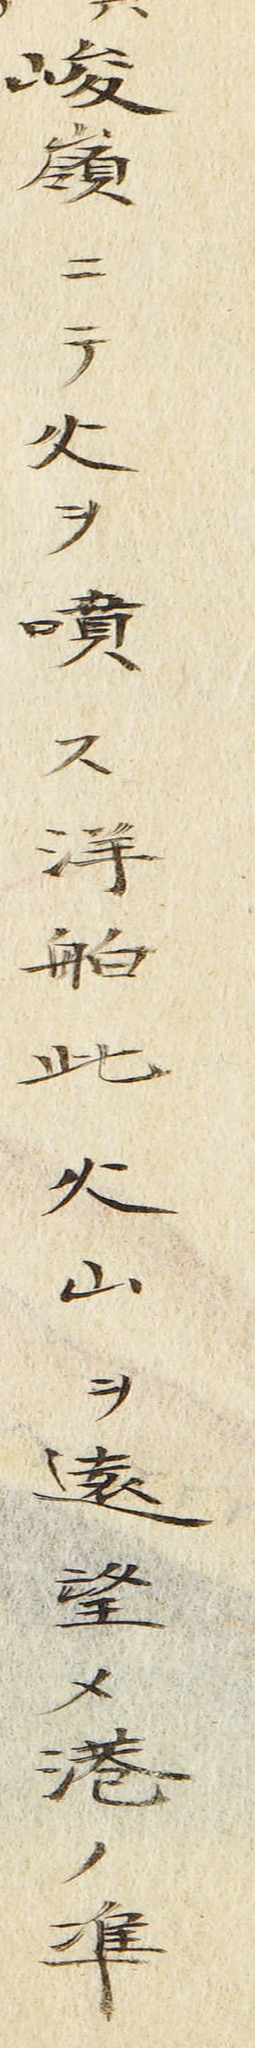峻嶺ニテ火ヲ噴ス洋舶此火山ヲ遠望シテ港ノ凖
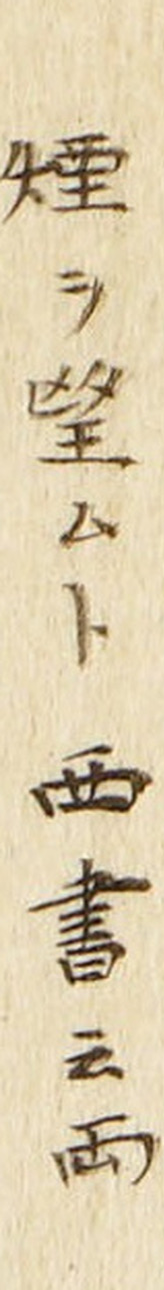煙ヲ望ムト西書云両
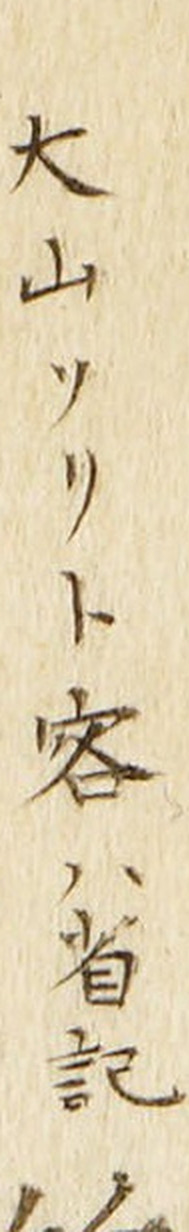大山ソリト客ハ省記
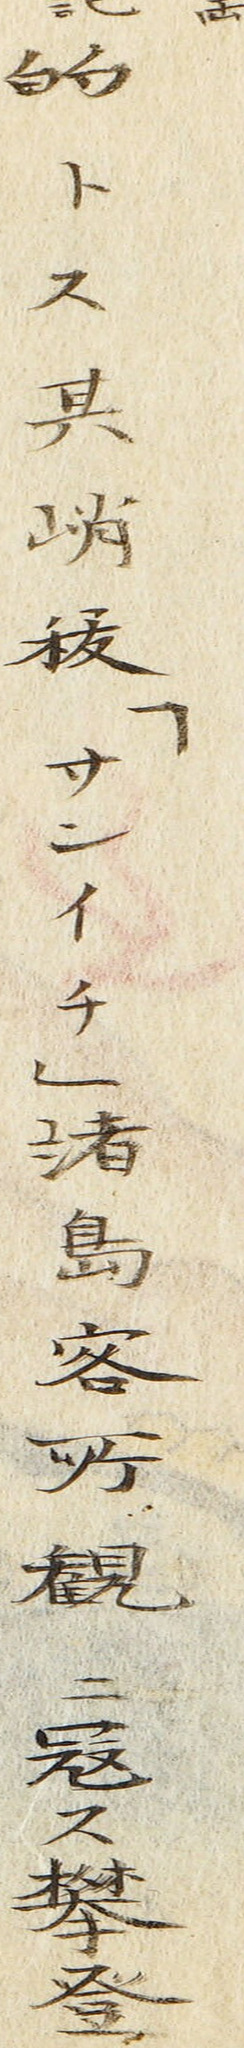的トス其峭秡「サンイチ」諸島客所観ニ寇ス攀登
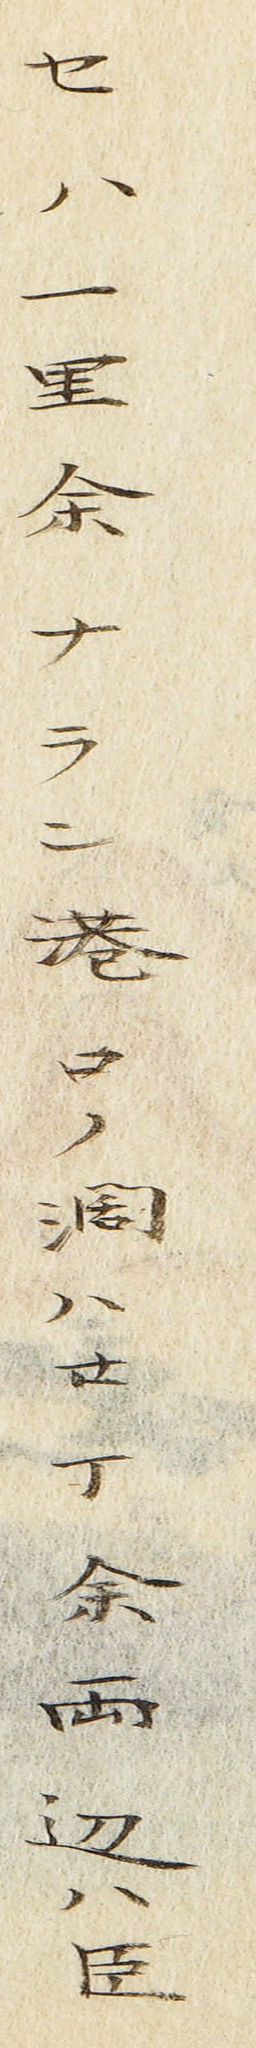セハ一里余ナラン港口ノ濶ハ廿丁余両辺ハ臣
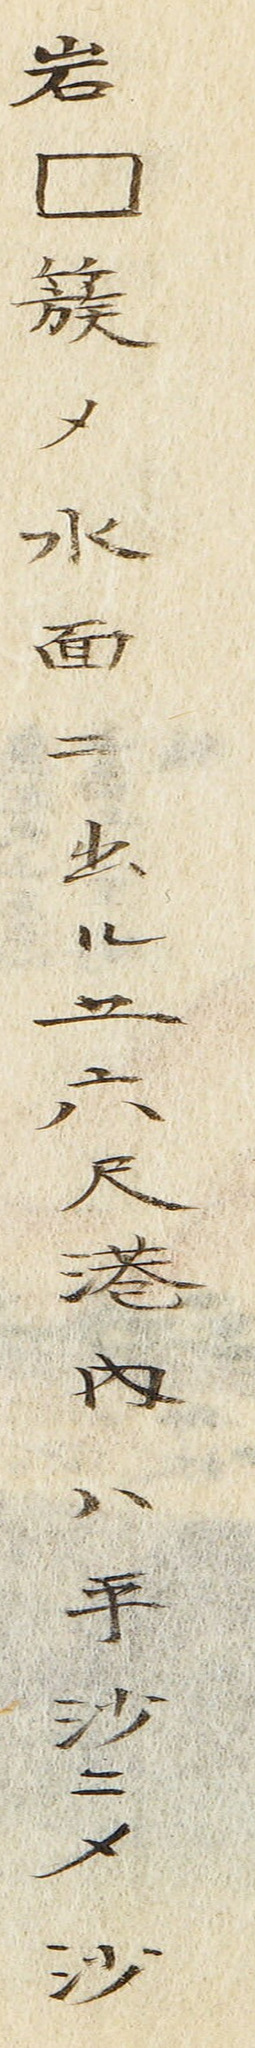岩▢簇シテ水面ニ出ル五六尺港内ハ平沙ニシテ沙
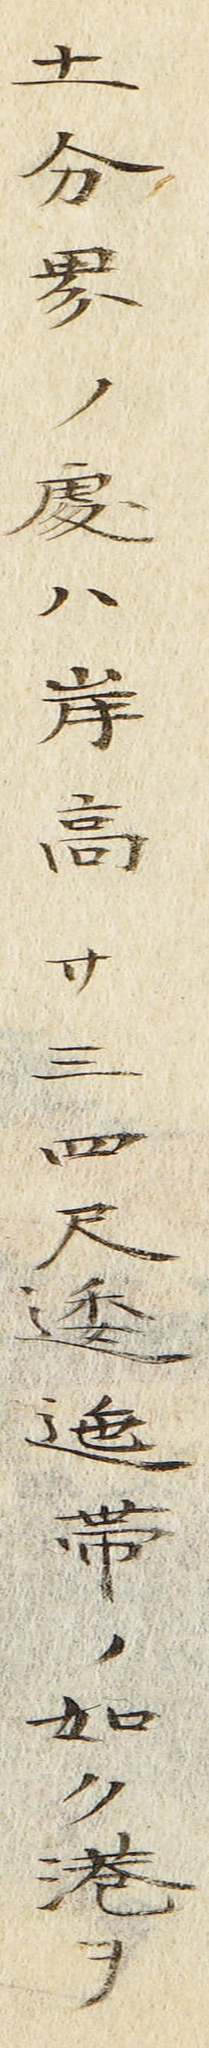土分界ノ処ハ岸高サ三四尺逶迤帯ノ如ク港ヲ
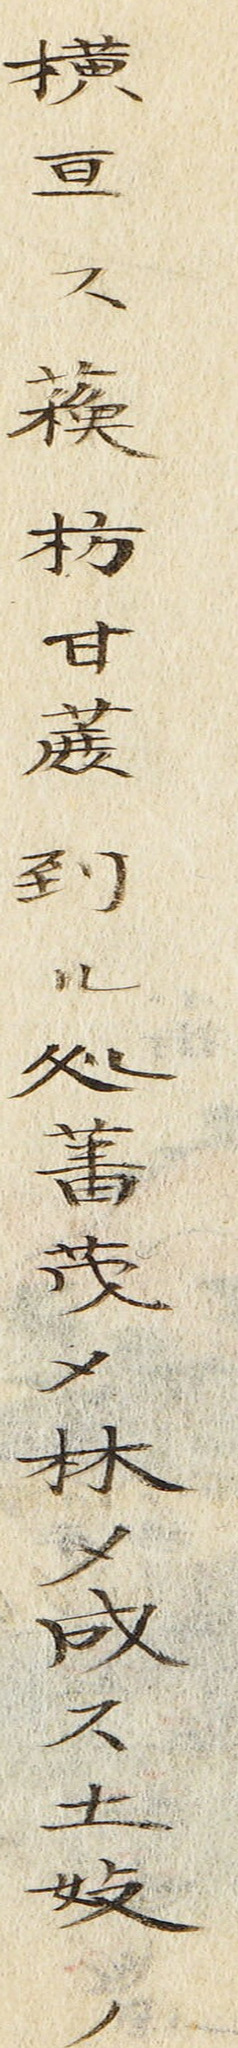横亘ス蘓枋甘蔗到ル処蕃茂シテ林シテ成ス土妓ノ
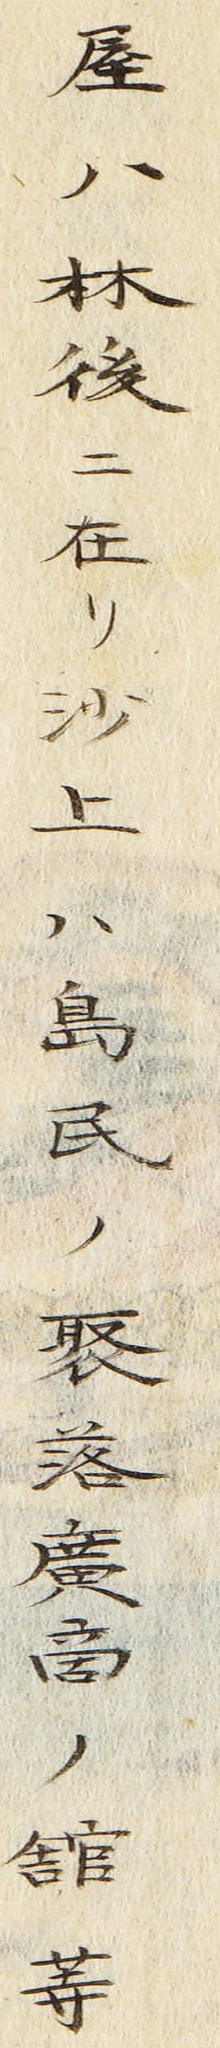屋ハ林後ニ在リ沙上ハ島民ノ聚落広商ノ館等
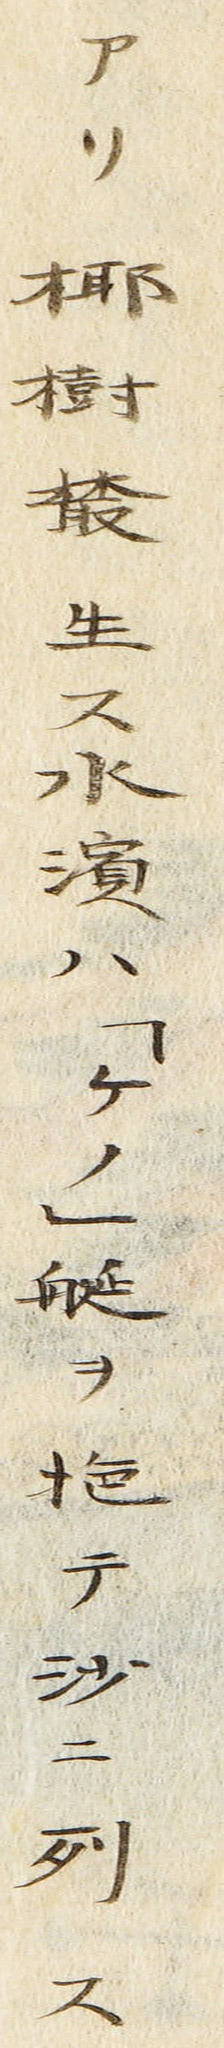アリ椰樹樷生ス水浜ハ「ケノ」艇ヲ拖テ沙ニ列ス
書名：流蕃通書
